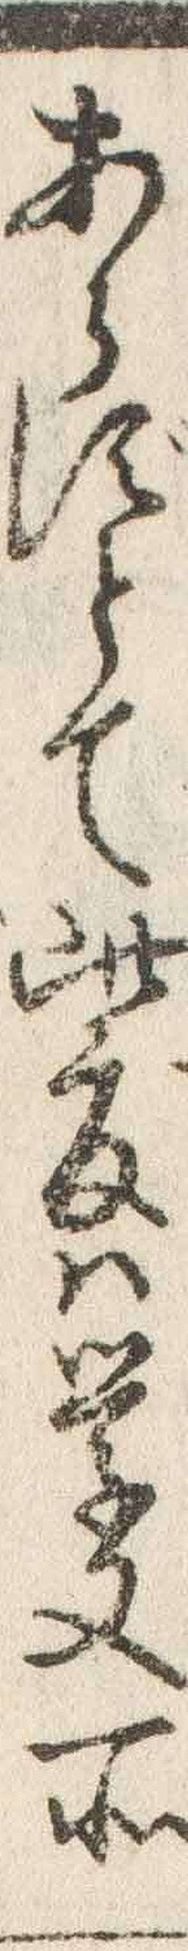あらずとて此度は学問所
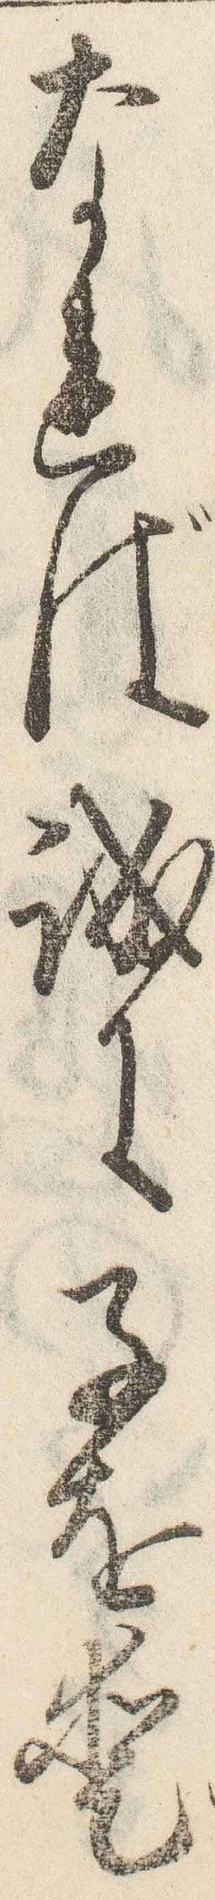なれば誠に子を愛
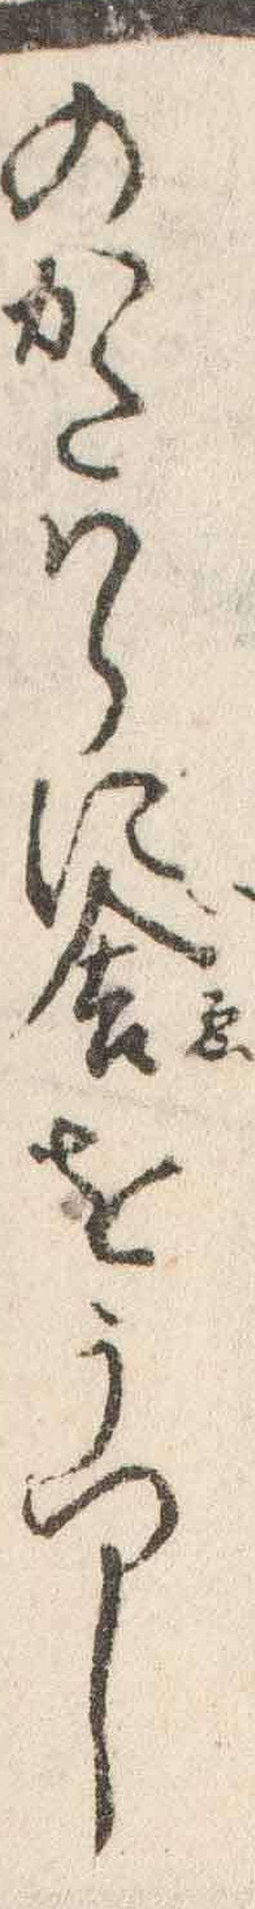のかたはらに舎をうつし
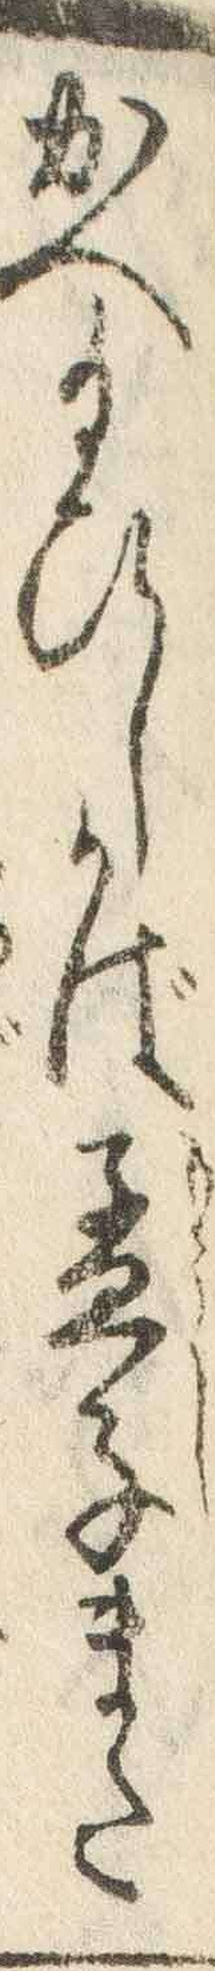かへ給ひしかば孟子また
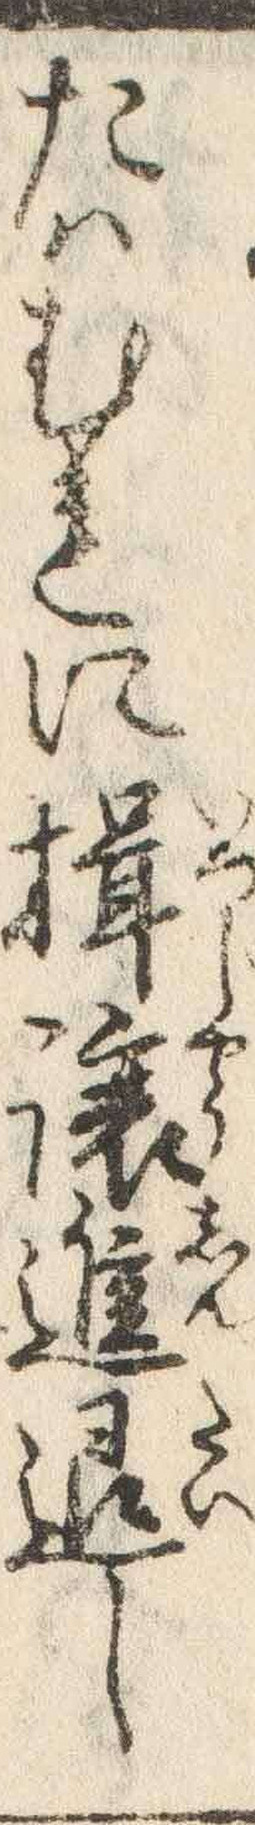たはむれに揖譲進退し
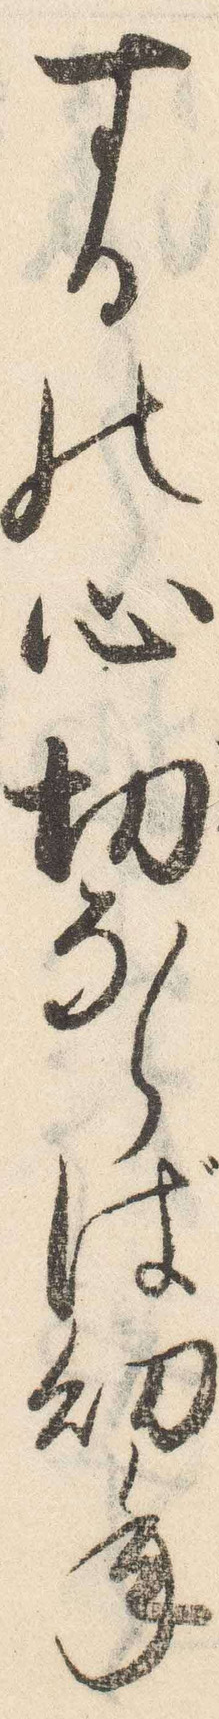するの心切ならば幼年
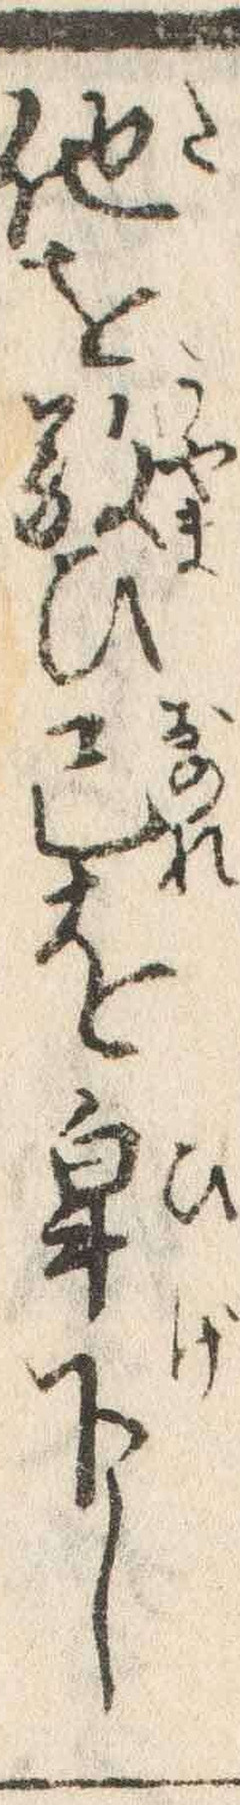他を敬ひ己を卑下し
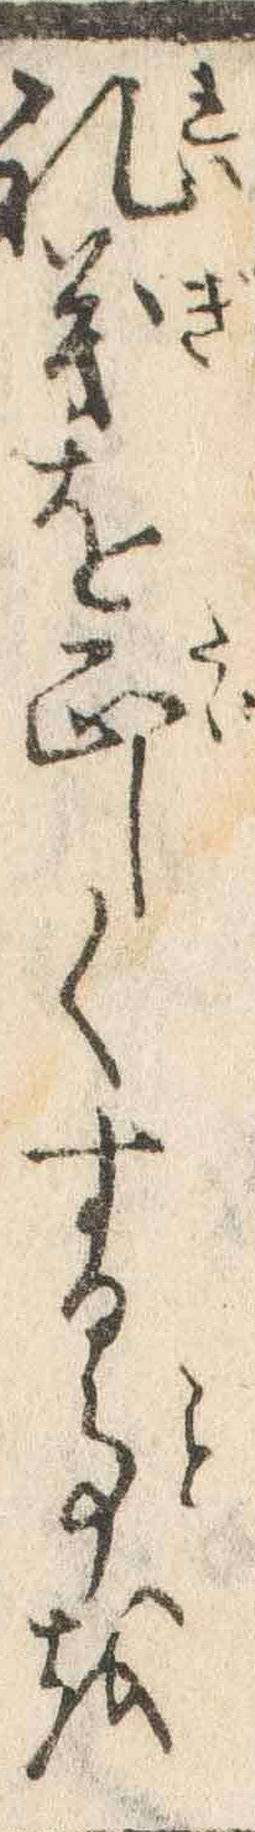礼義を正しくする事を
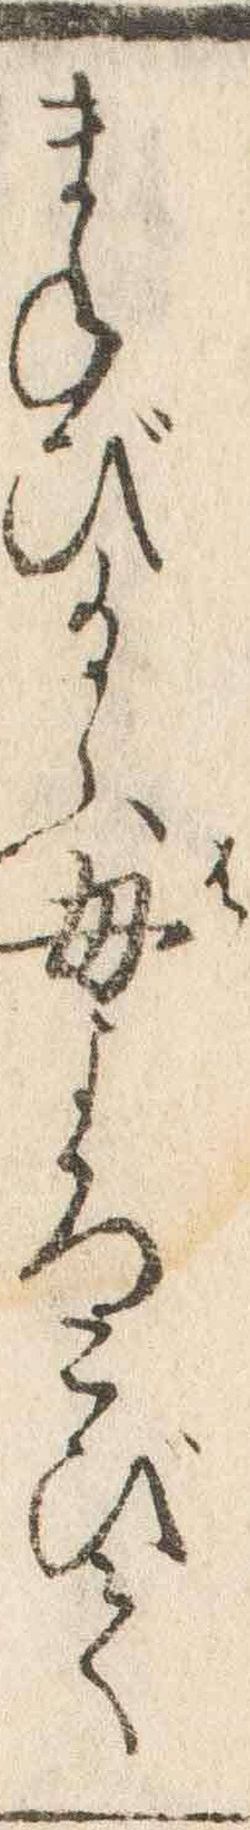まねび給ふ母よろこびて
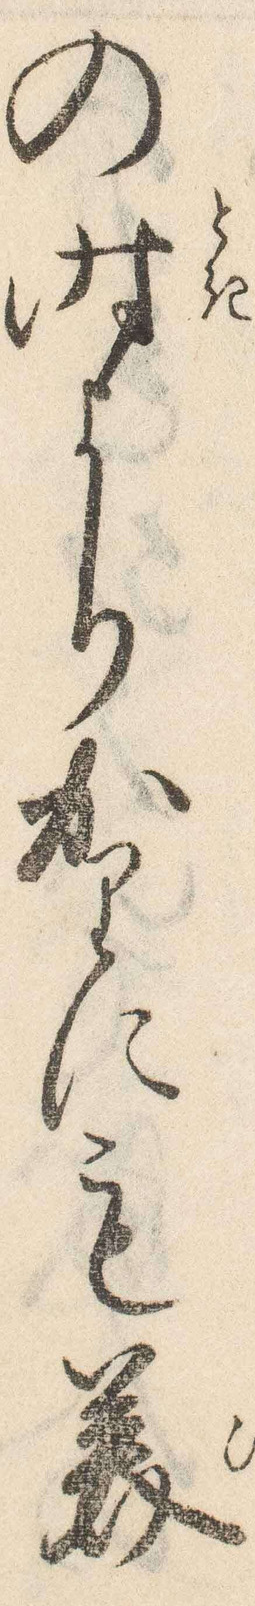の時よりかりにも美
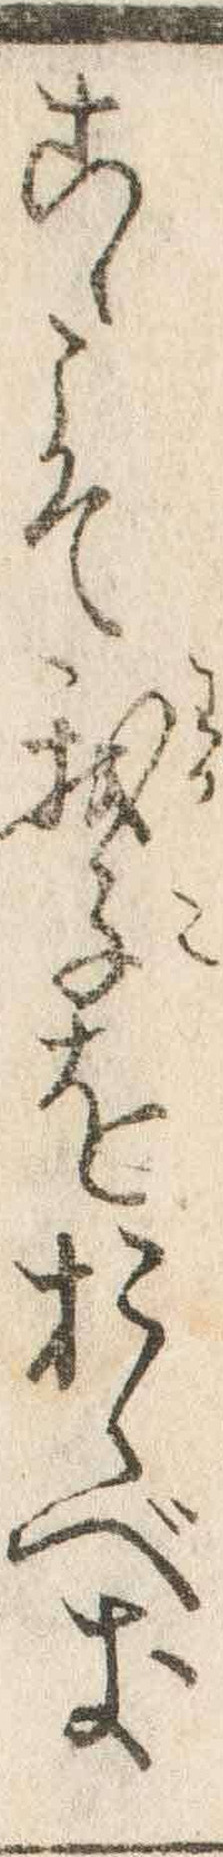こゝにて我子をおくべき
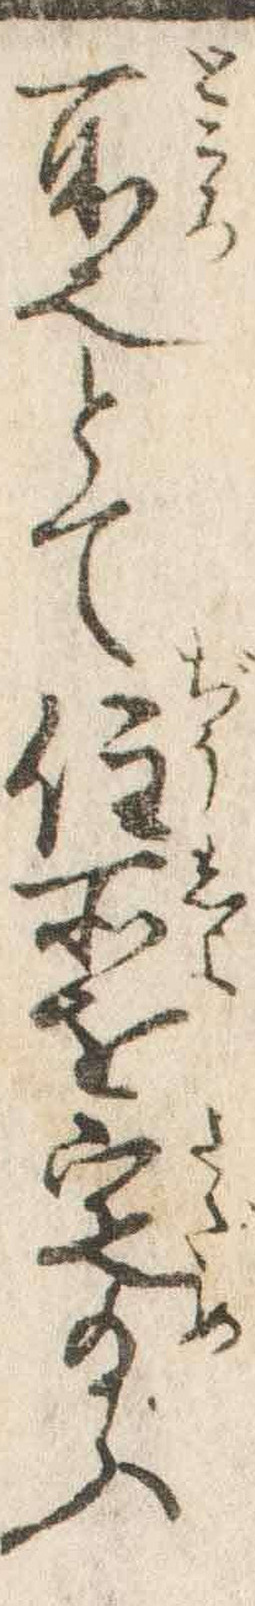所也とて住所を定給ふ
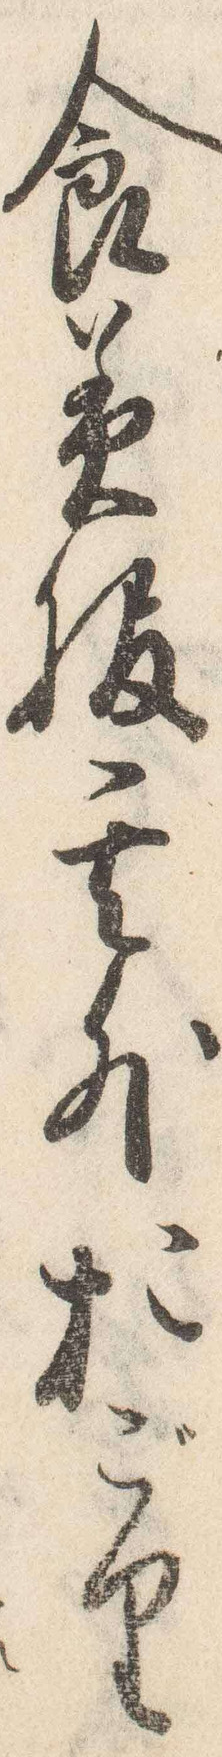食美服其外おごり
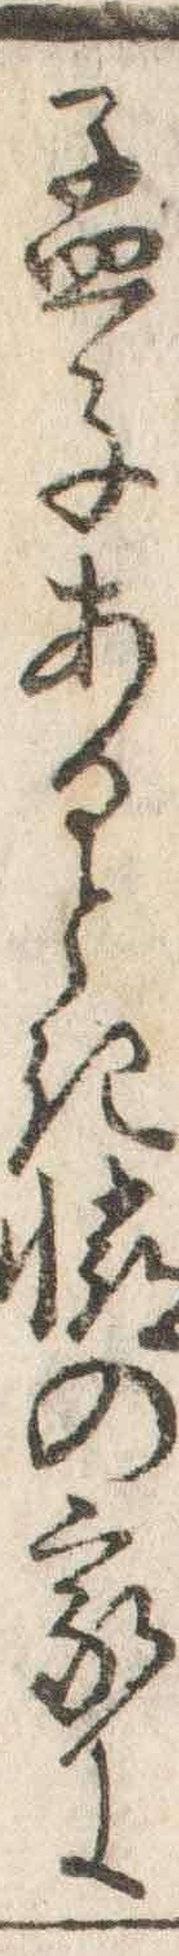孟子あるとき隣の家に
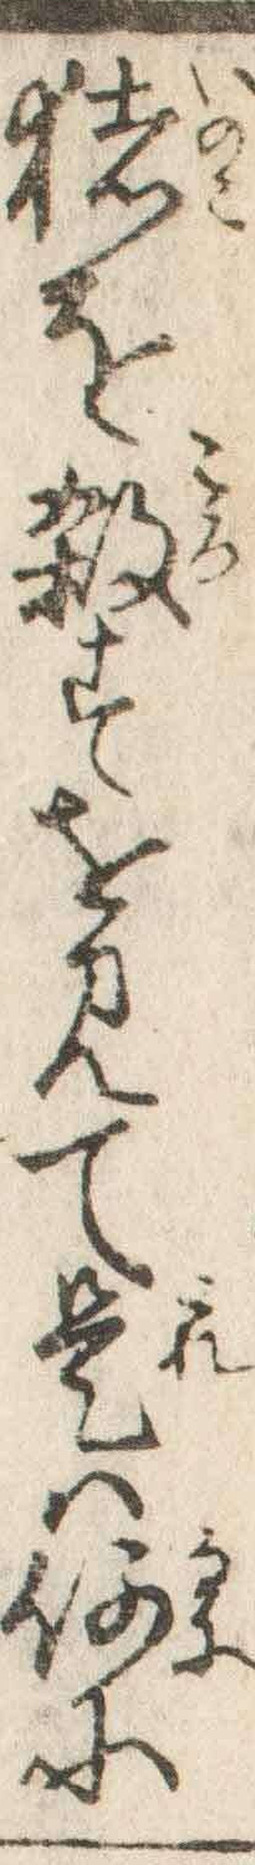猪を殺すを見て是は何に
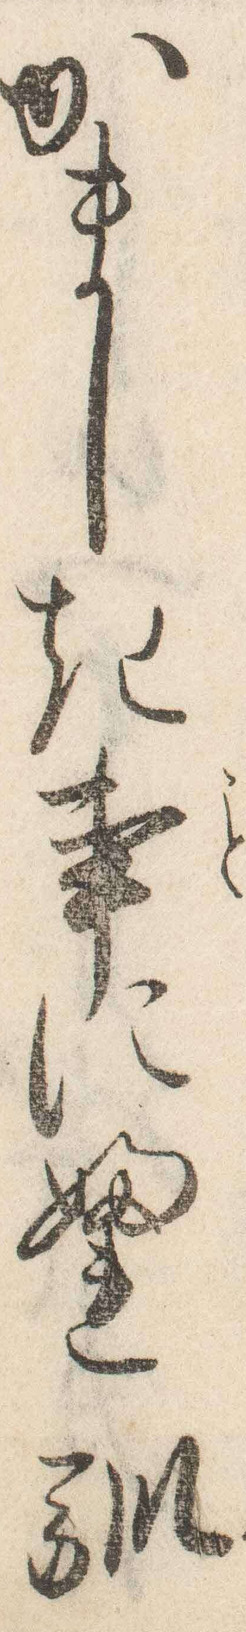かましき事にふれ馴
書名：撫育草
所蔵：東京学芸大学附属図書館 国文学研究資料館
